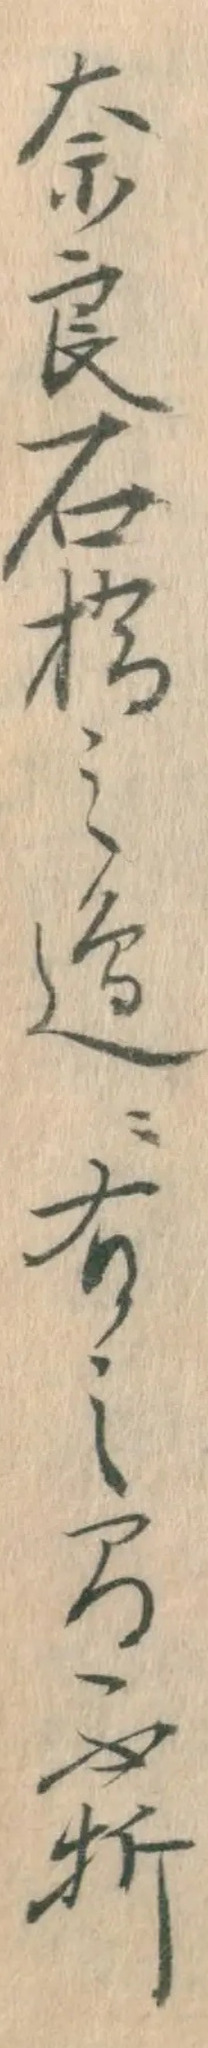奈良石橋之辺に有之間不折
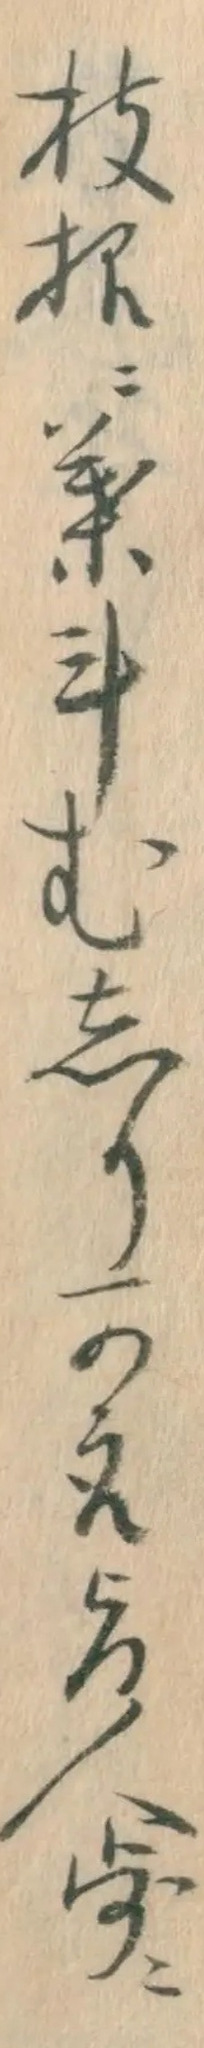枝根に葉斗むしり可取旨人歩に

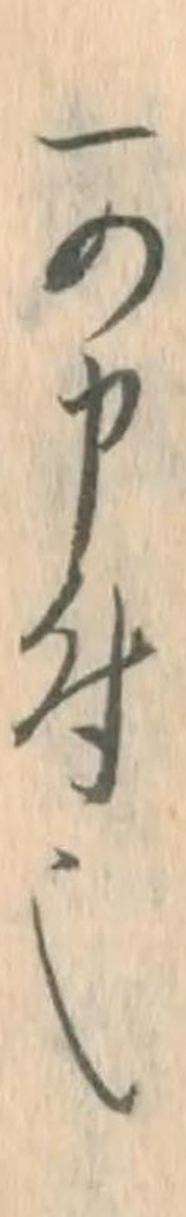可申付也
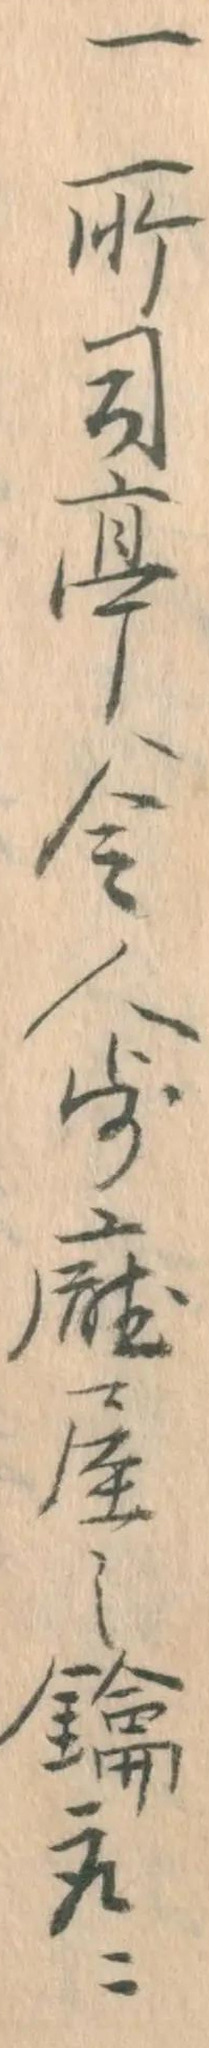一所司亭へ令人歩庁屋之鑰取ニ
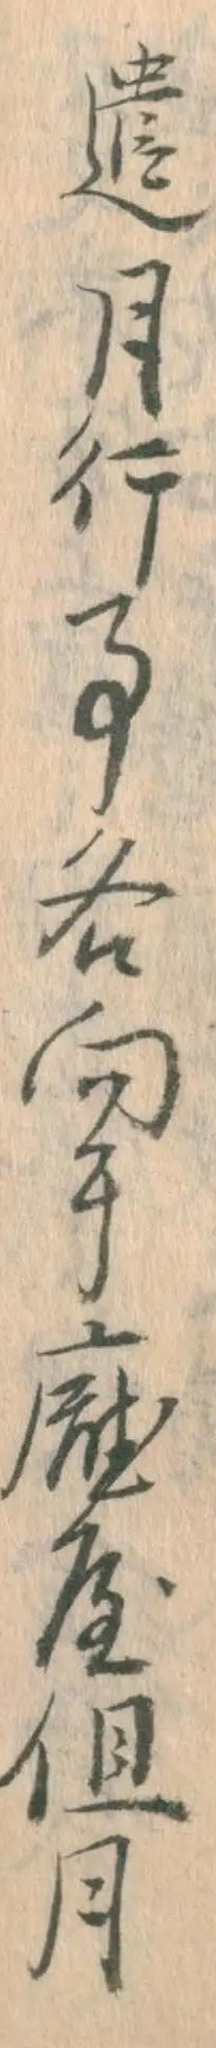遣月行事各向于庁屋但月
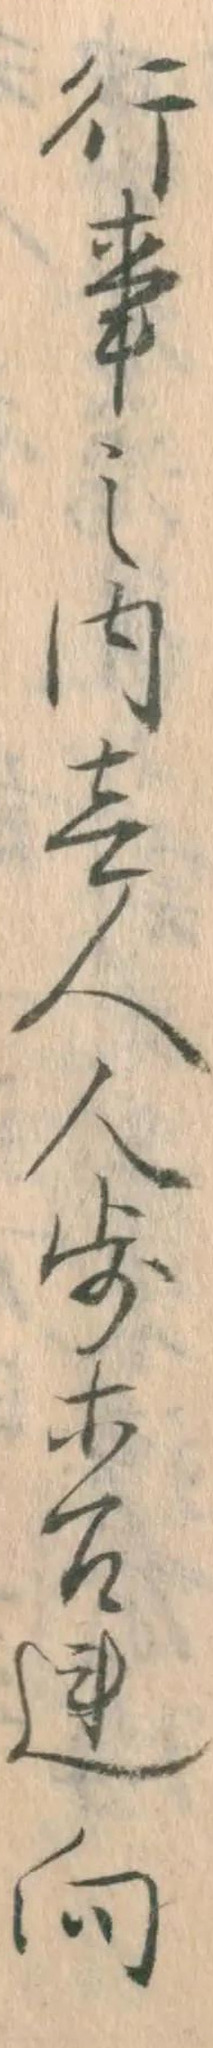行事之内壱人人歩等召連向
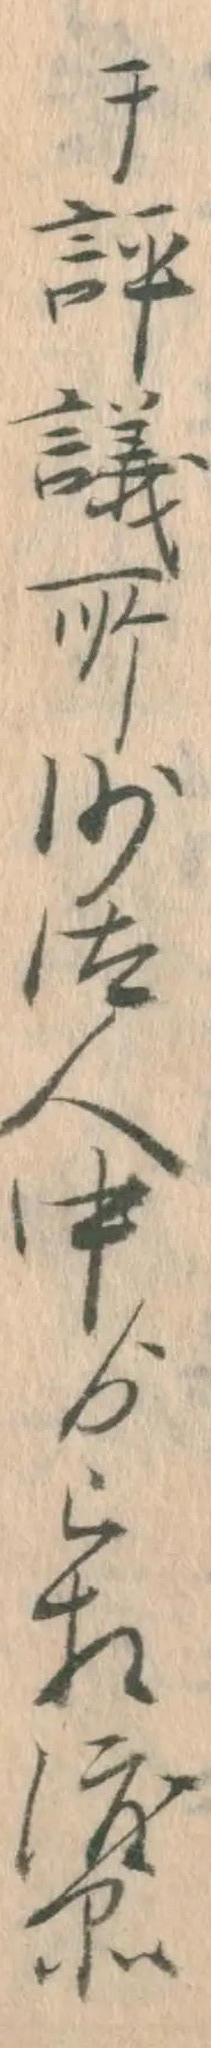于評議所沙汰人中ゟ被相渡品
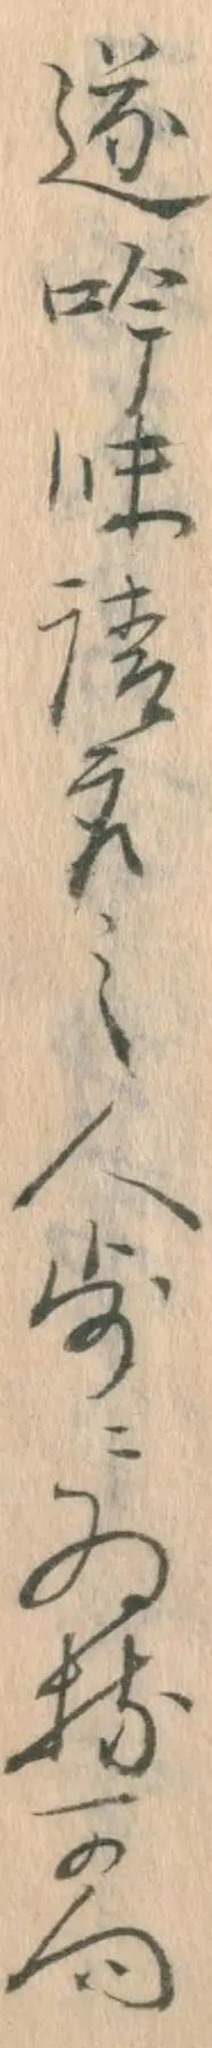遂吟味請取之人歩ニ為持可向
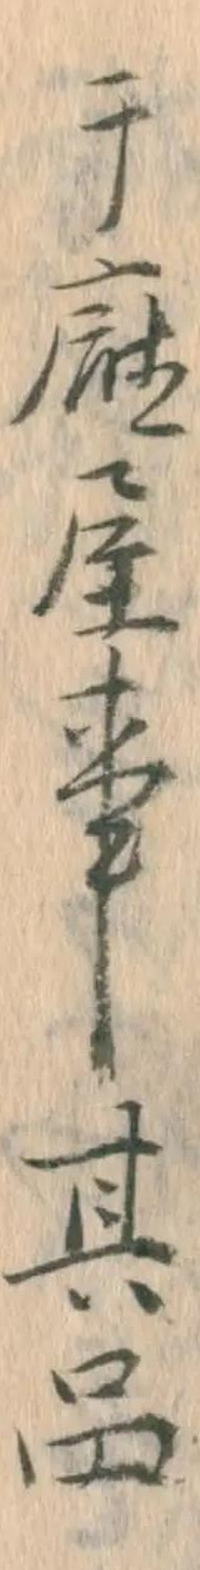干庁屋事其品
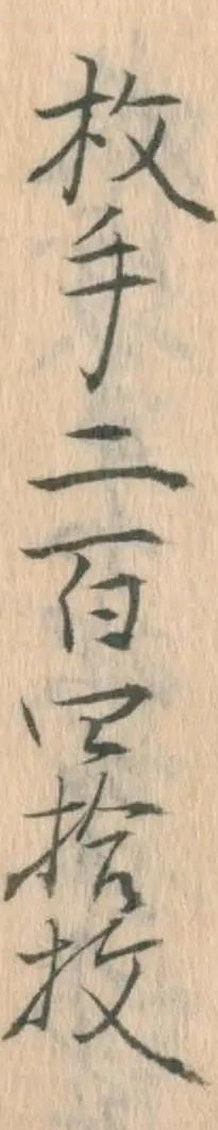枚手二百四拾枚
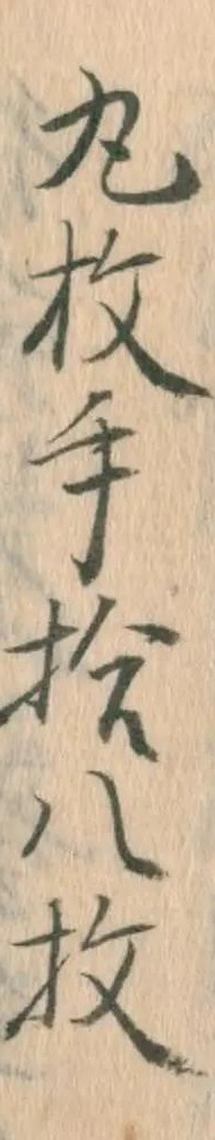丸枚手拾八枚
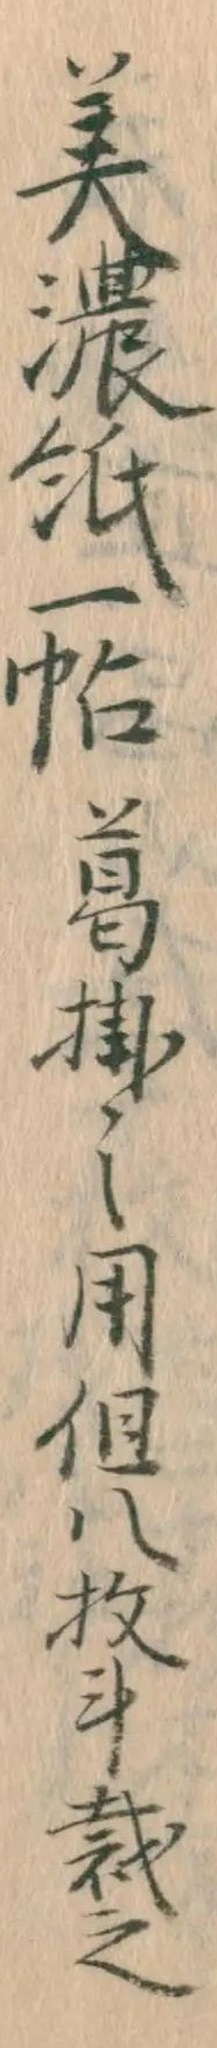美濃紙一帖葛掛之用但八枚斗裁之
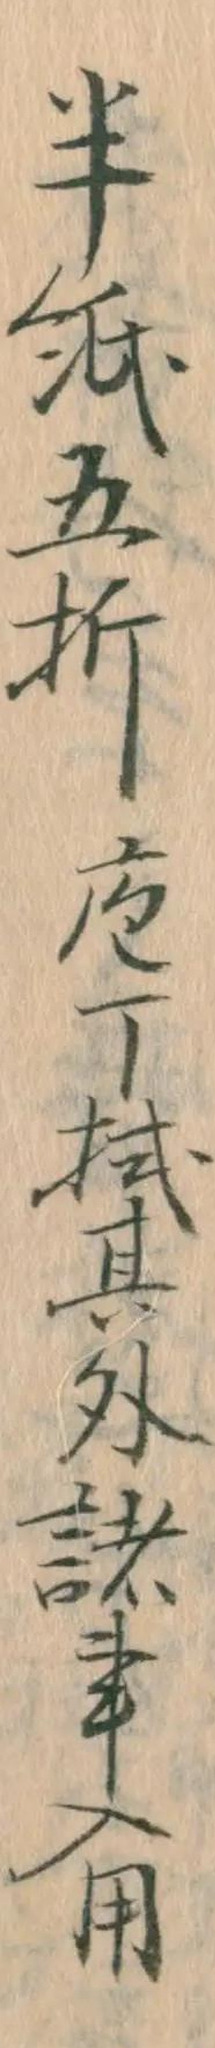半紙五折包丁拭其外諸事入用

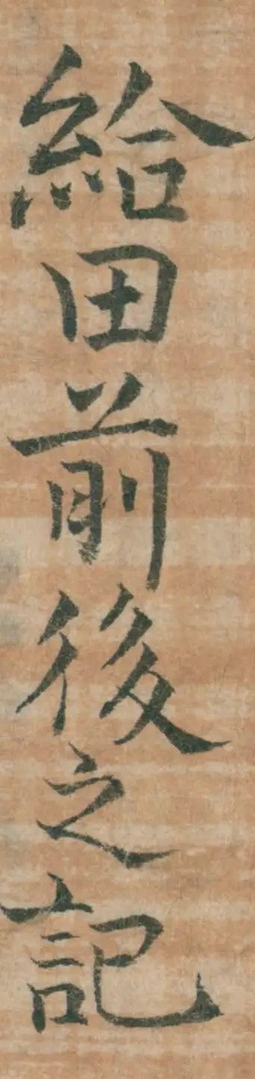給田前後之記

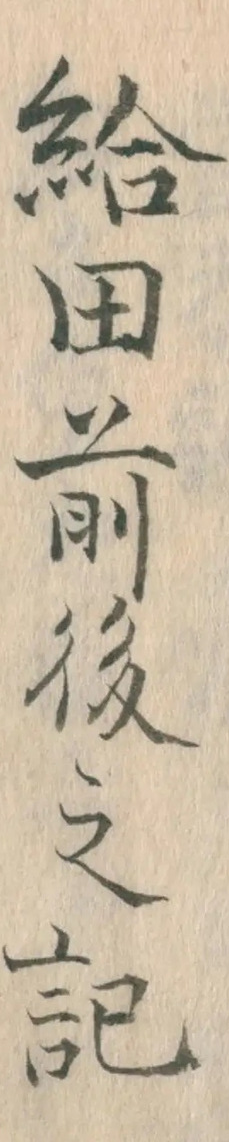給田前後之記

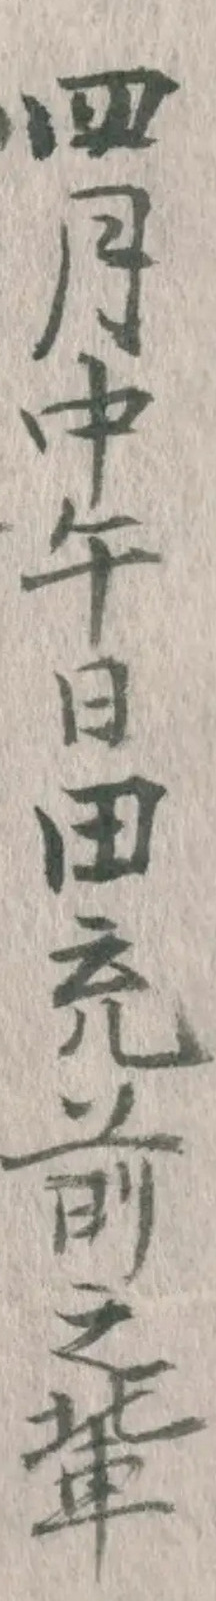四月中午日田充前之輩
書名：賀茂社記録. 第81冊
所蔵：国立国会図書館 National Diet Library, JAPAN
